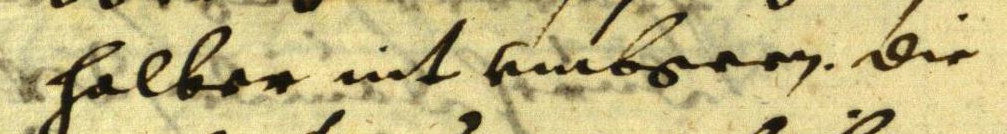halber nit vmbgeen. die
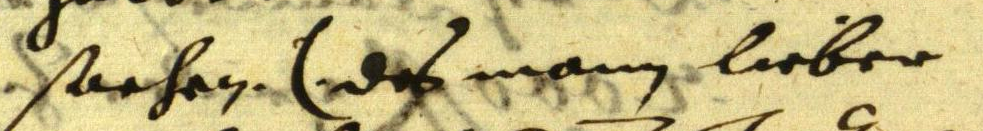sachen .(.des mann lieber
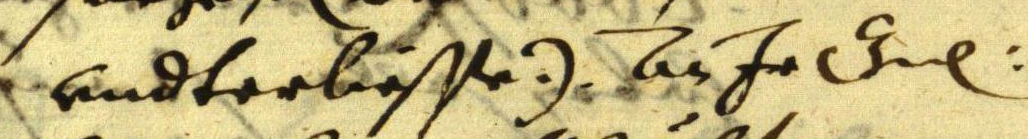vndterliesse.). An Ir Gn:
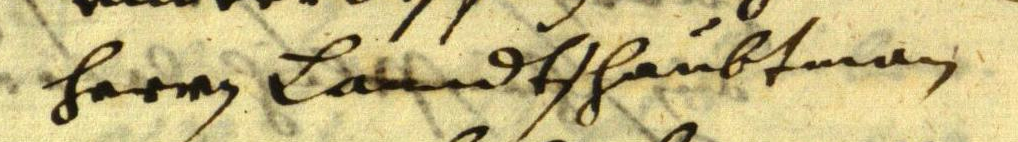herrn Lanndtshaūbtman
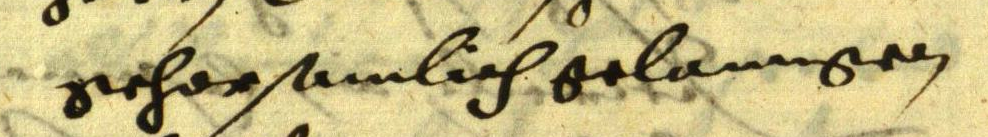gehorsamlich gelanngen
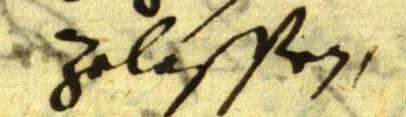Zelassen,
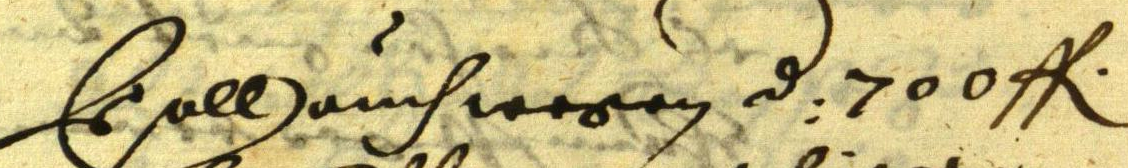Es soll aūch wegen d: 700 fl.
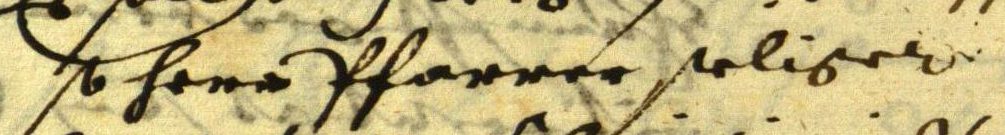so herr Pfarrer seliger
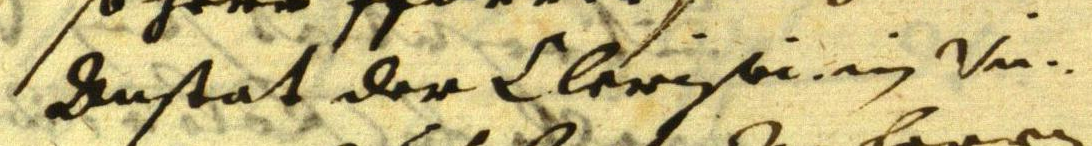Anstat der Clerisei. in Vn¬
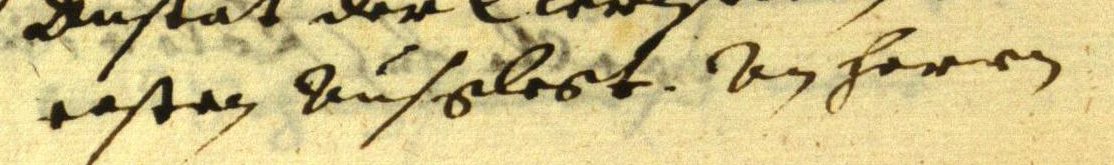costen Aūsglegt. An heren
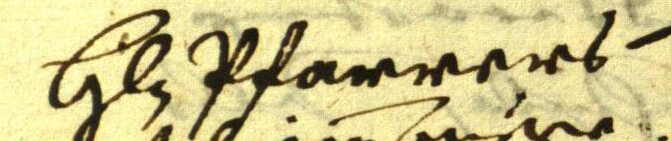Hln Pfarrers
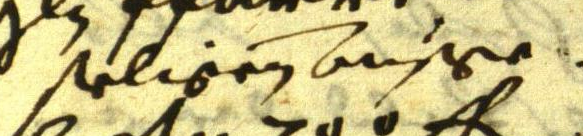seligen Aūsge¬
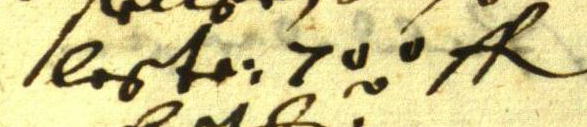legte: 700 fl
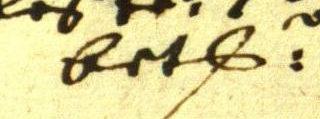bet:
